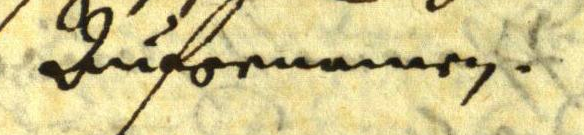Aūfgenomen.
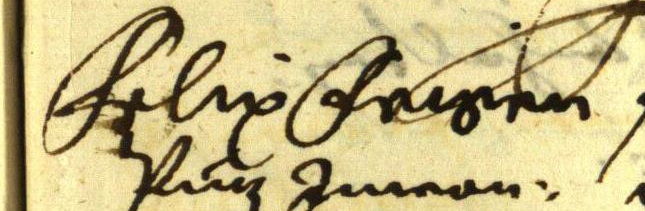Felix Feigen
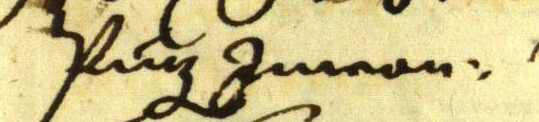Pūz Inwon¬
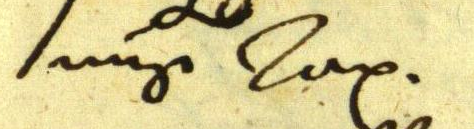ūng Tax.
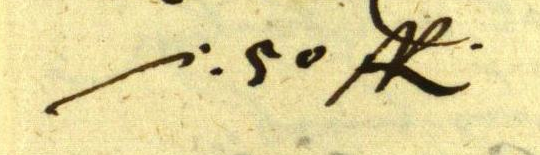—: 50 fl.
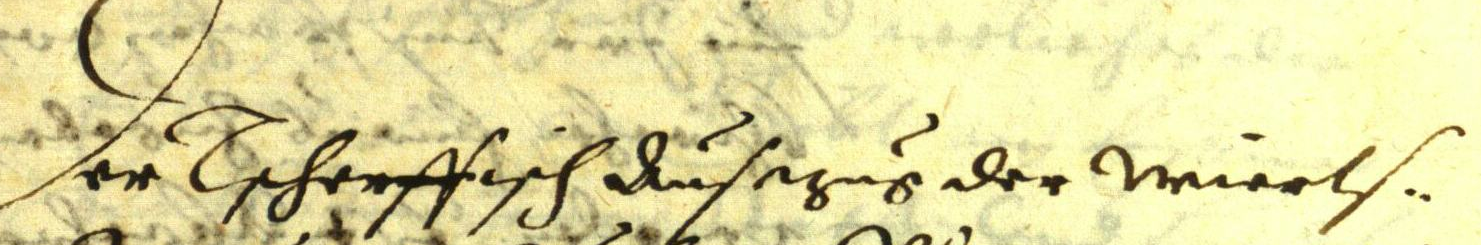Der Tscherffisch Aūszūg der Wierts¬
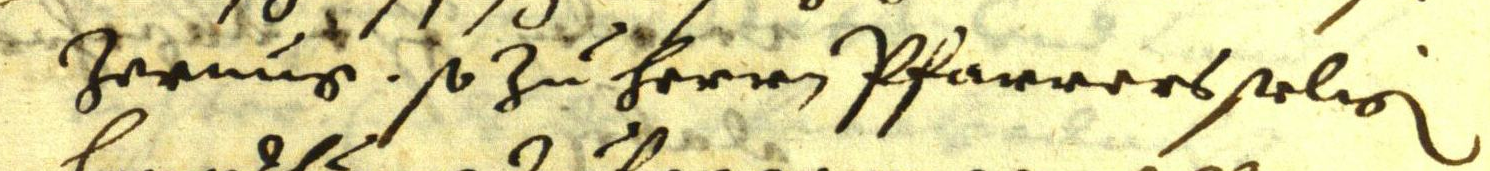Zerūng. so Zū herrn Pfarrers selig
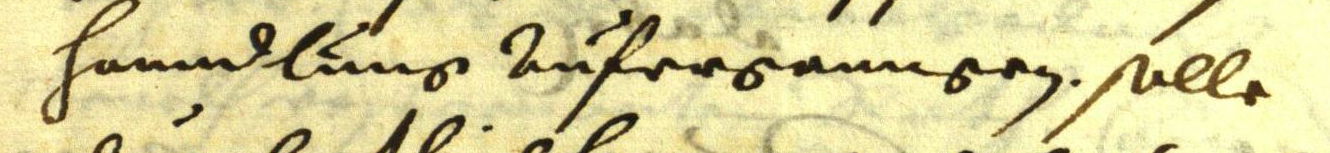hanndlūng Aūferganngen. solle
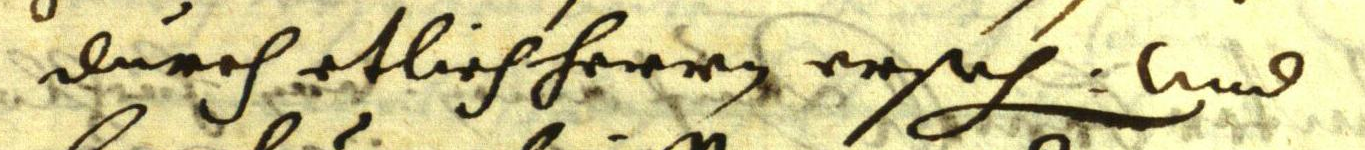dūrch etlich herrn ersch: vnd
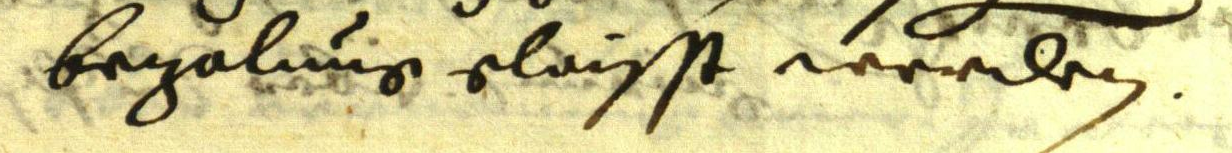bezalūng glaisst werden.
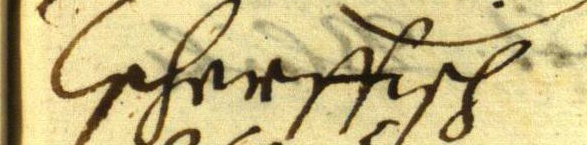Tscherffisch
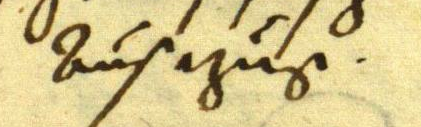Aūszūg.
